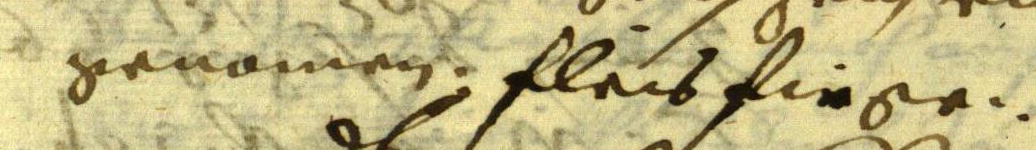genomen. fleis firge¬
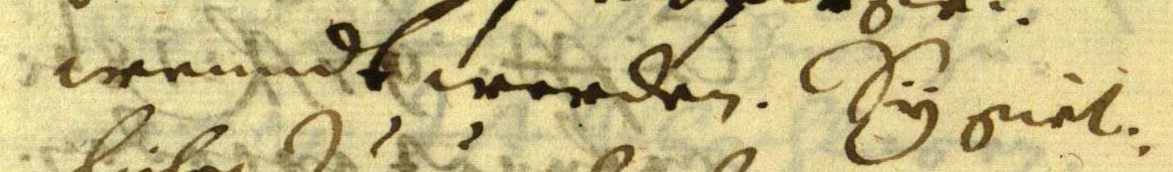wenndt werden. Sÿ gūet¬
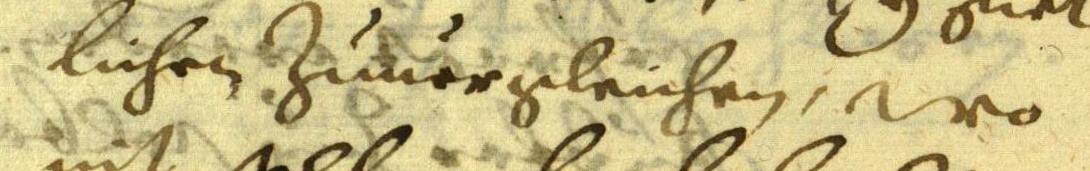lichen Zūūergleichen, wo
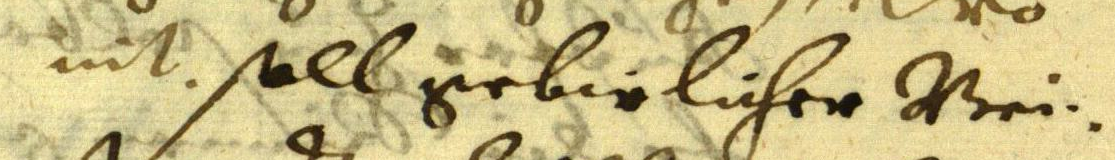nit. soll gebirlicher Bei¬
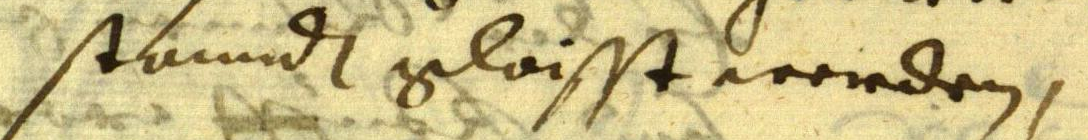stanndt glaisst werden,
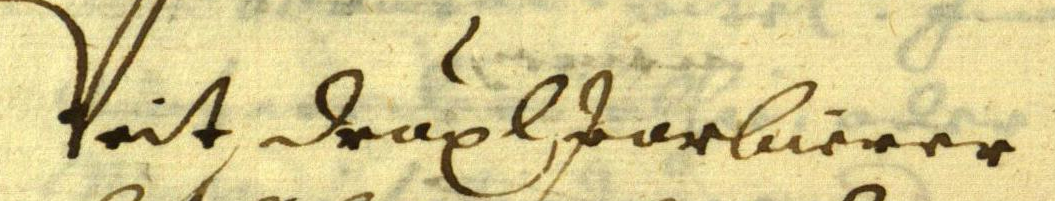Veit Drāxl parbierer.
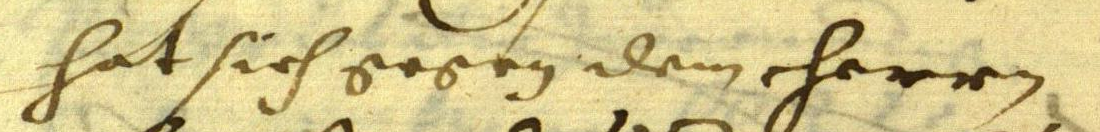hat sich gegen dem herrn
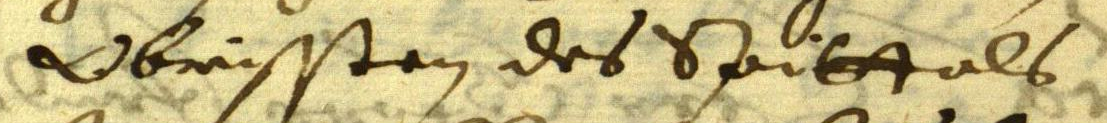Obrissten des Spittals
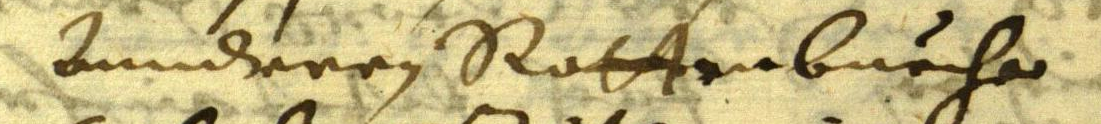Anndreen Rottenbūecher
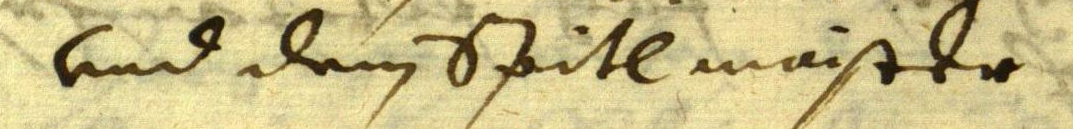vnd dem Spitl maister
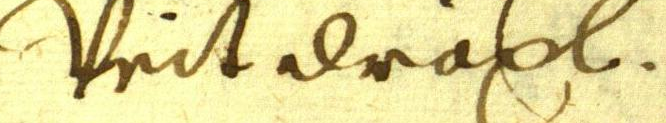Veit Drāxl.
